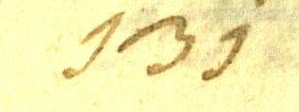131
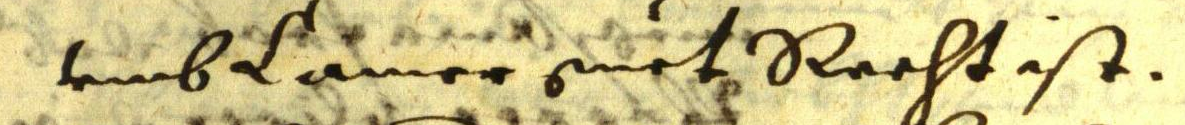vmb Camer gūet Recht ist.
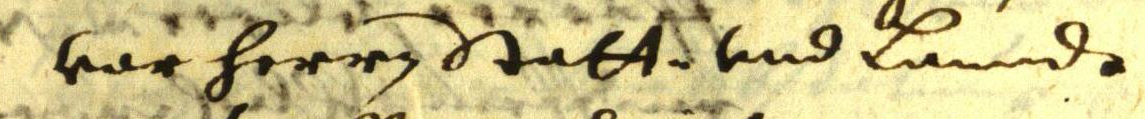vor herrn Statt: vnd Lanndt¬
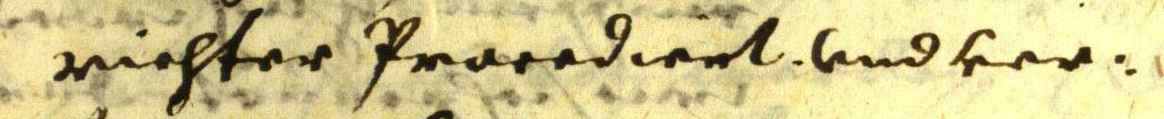richter Procediert. vnd ver¬
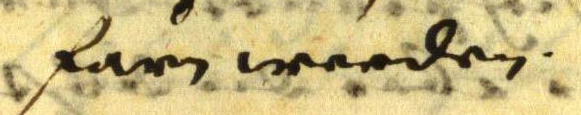farn werden.
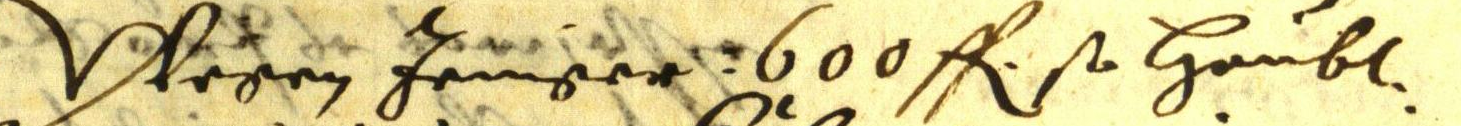Wegen Jeniger: 600 fl. so Haūbt¬
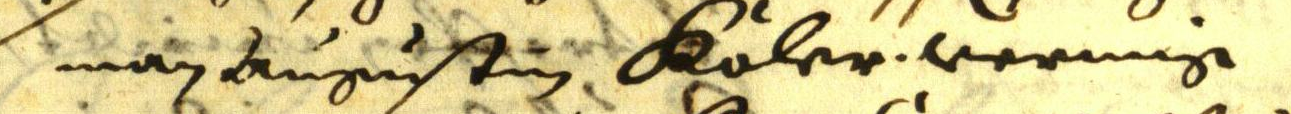man Aūgūstin Köler. vermig
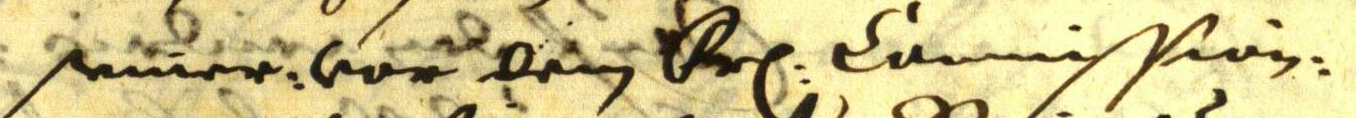seiner: vor dem Frl: Commission¬
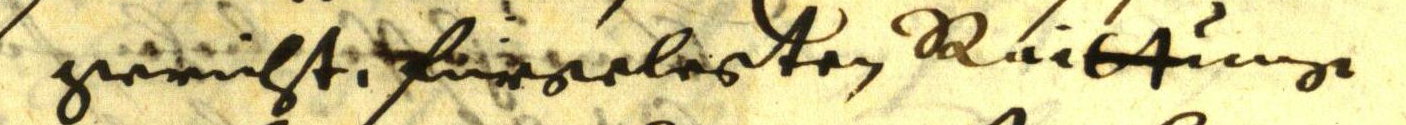gericht firgelegten Raittūng
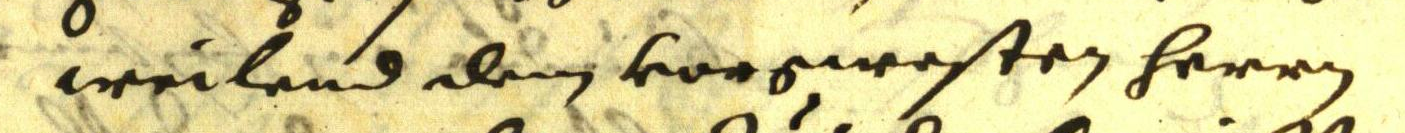weilend dem vorgwesten herrn
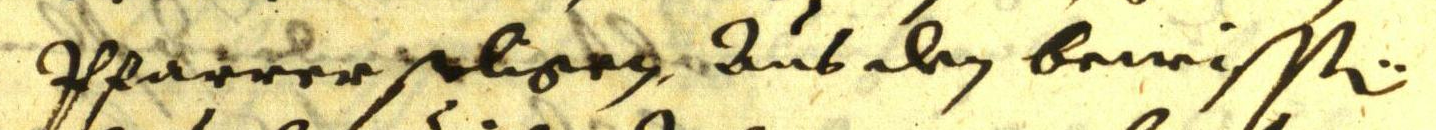Pfarrer seligen, Aūs den bewisst
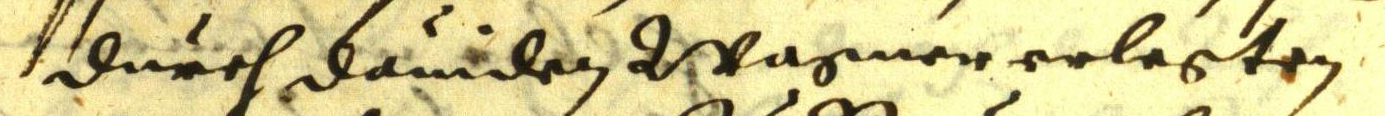dūrch Daūiden Wagner erlegten
